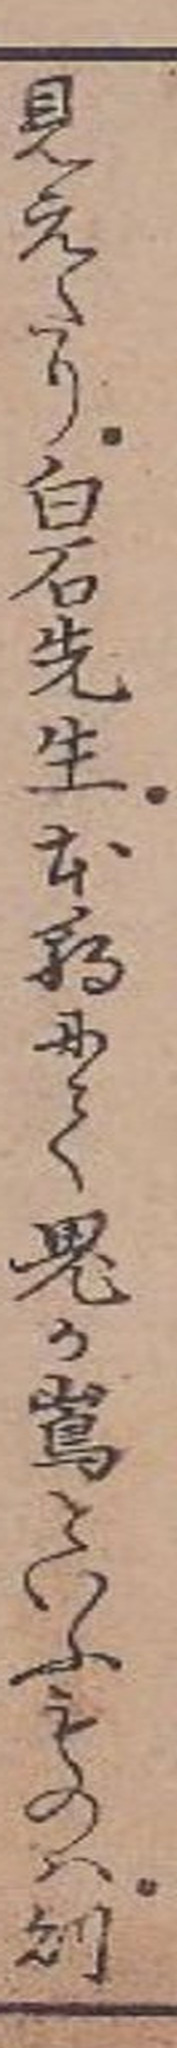見えたり、白石先生、本朝にて鬼か島といふものは、則
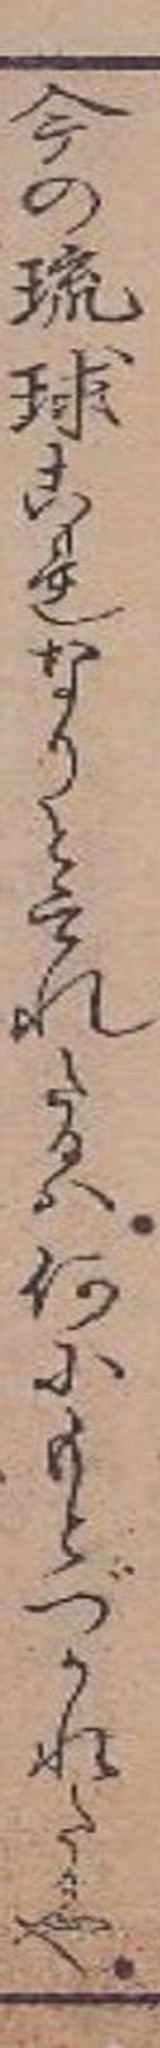今の琉球これなりと云れたるは、何にもとづかれたるや、
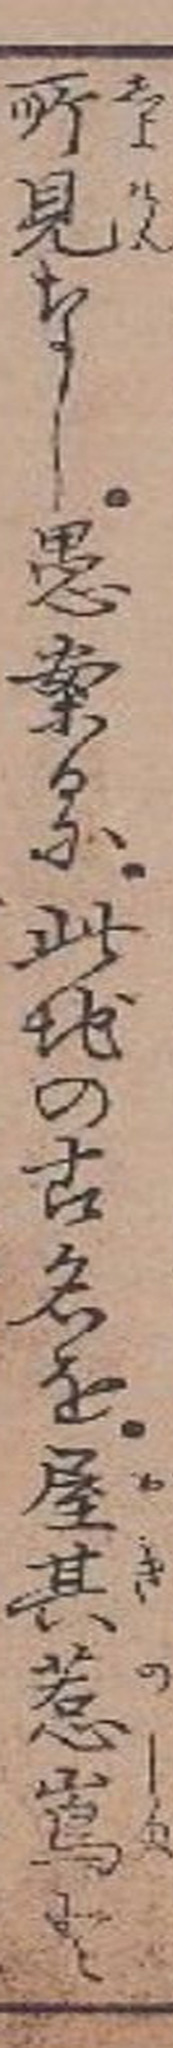所見なし、愚案るに、此地の古名を、屋其惹島と
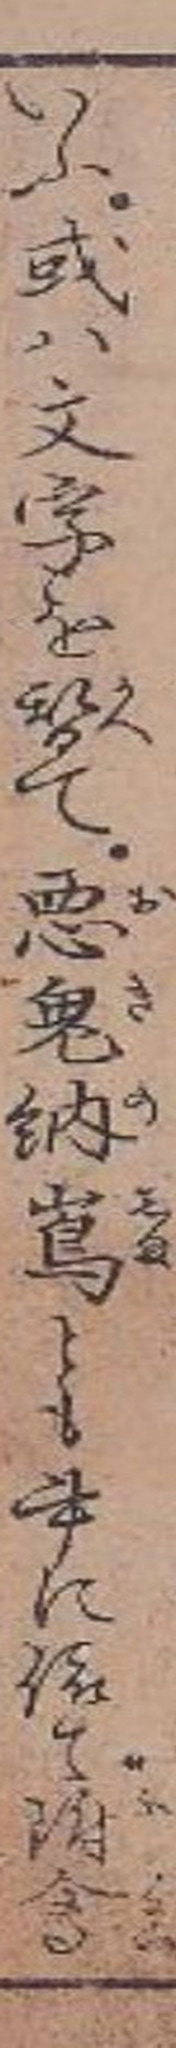いふ、或は文字を替て、悪鬼納島とも書に依て、附会

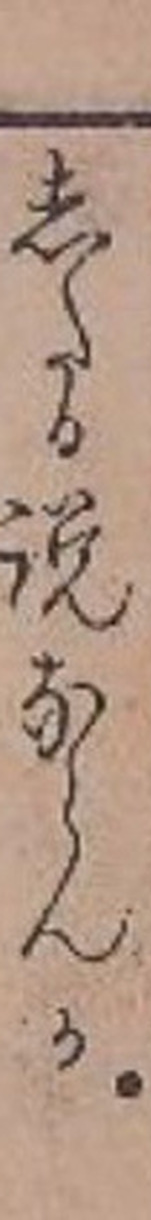したる説ならんか、
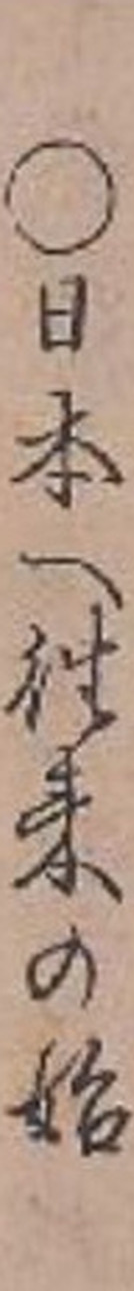○日本へ往来の始
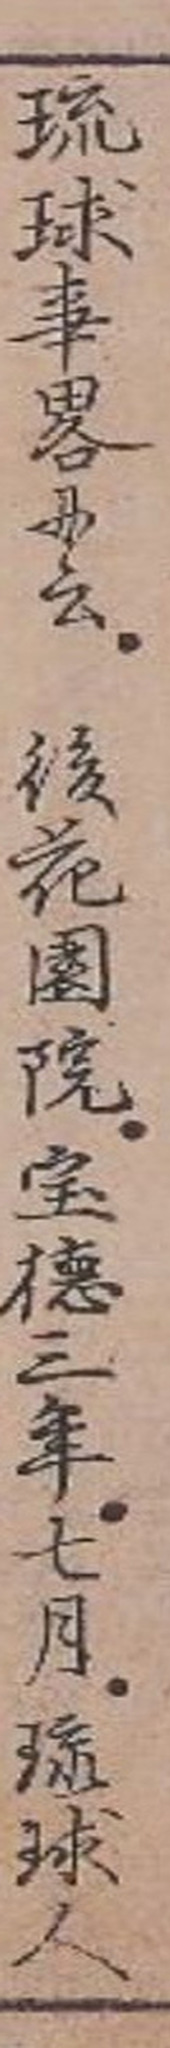琉球事略に云、後花園院、宝徳三年、七月、琉球人
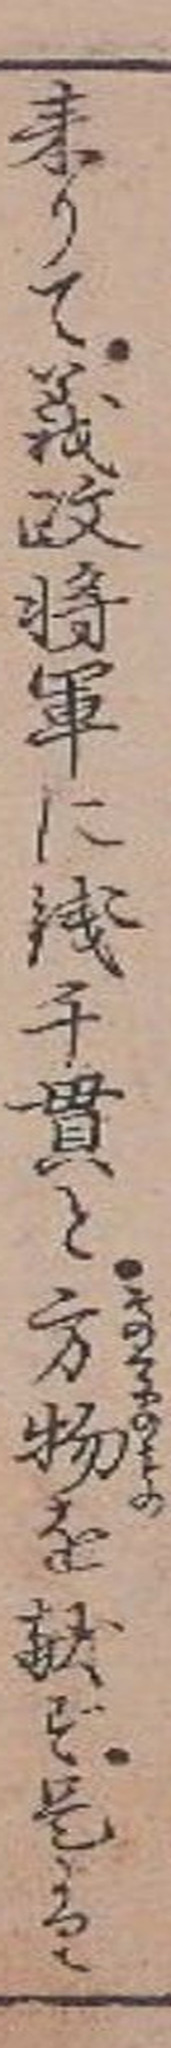来りて、義政将軍に銭千貫と、方物を献ず、是より
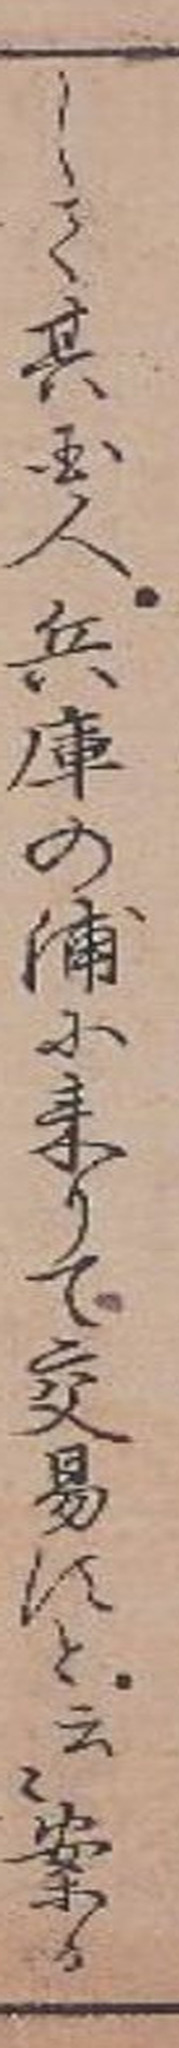して其国人、兵庫の浦に来りて交易すと、云々案る
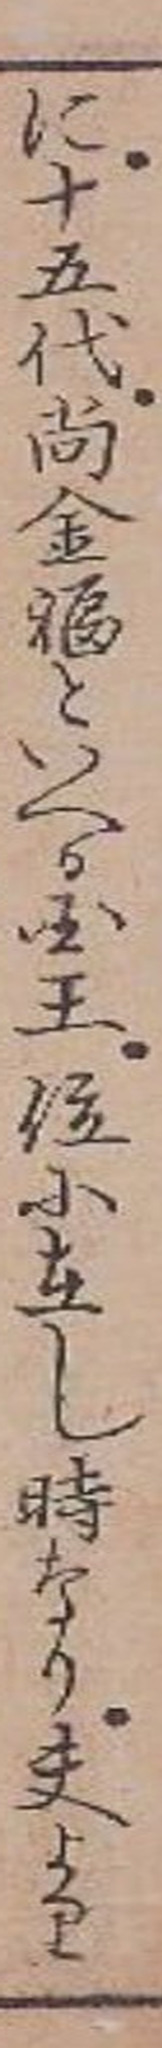に、十五代、尚金福といへる国王、位に在し時なり、夫より
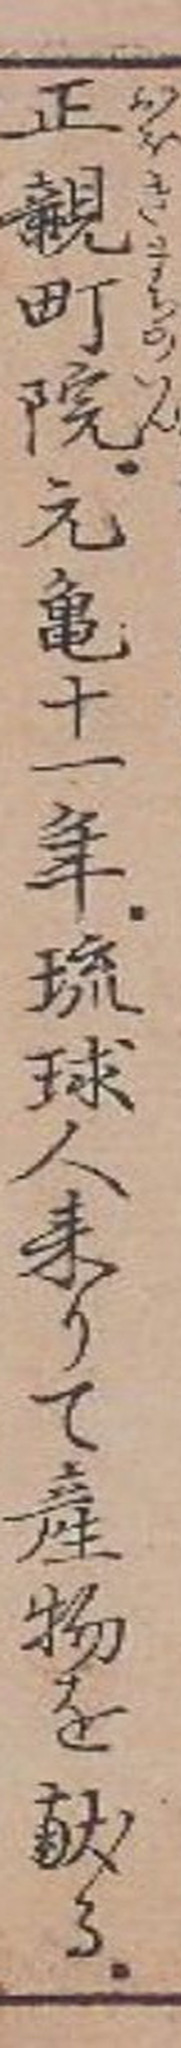正親町院、元亀十一年、琉球人来りて産物を献る、
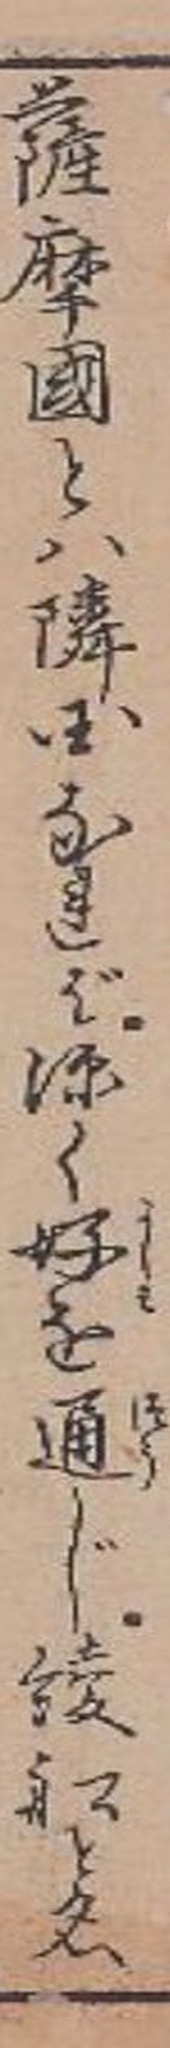薩摩国とは隣国なれば、深く好を通じ、綾船と名
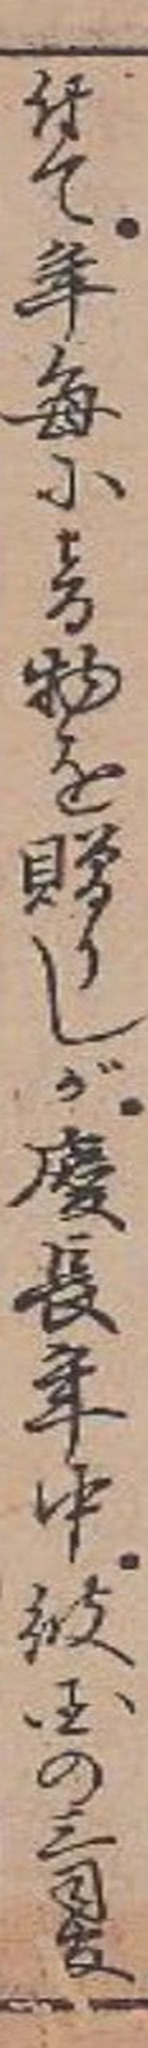付て、年毎に音物を贈りしが、慶長年中、彼国の三司官、
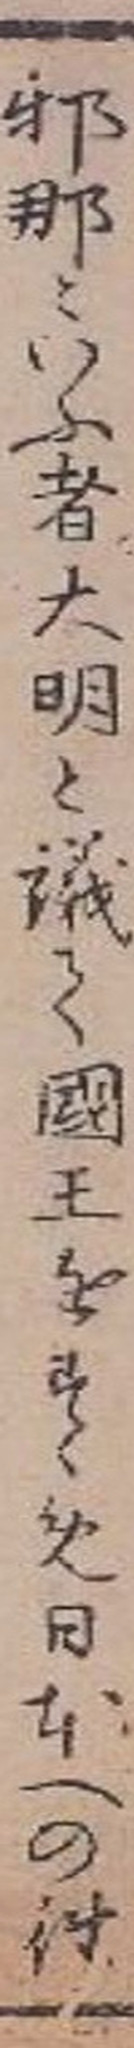邪那といふ者、大明と議て国王をすゝめ日本への往
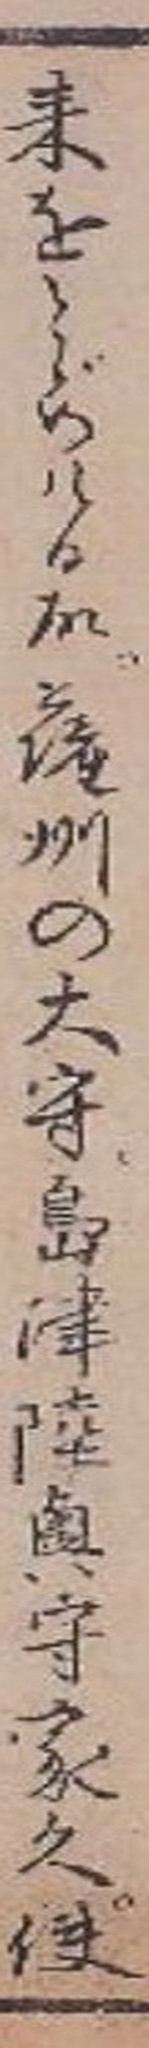来をとゞめける故、薩州の太守、島津陸奥守家久、使
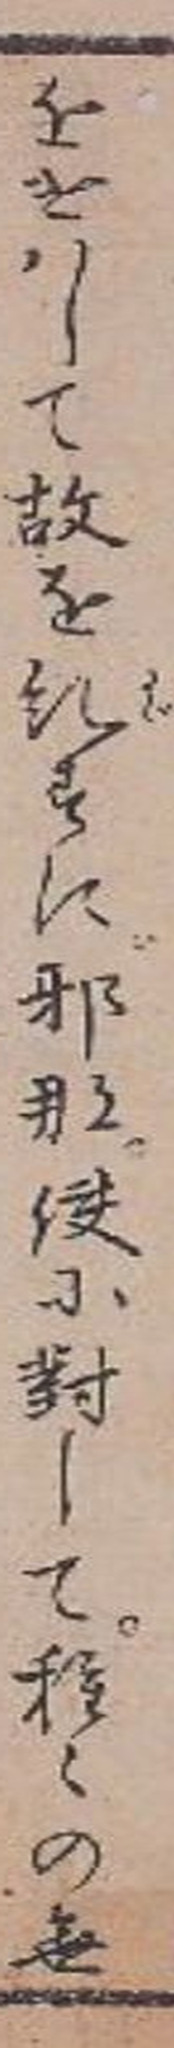を遣はして故を糺すに、邪那、使に対して、種々の無
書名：琉球談
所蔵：University of the Ryukyus Library
